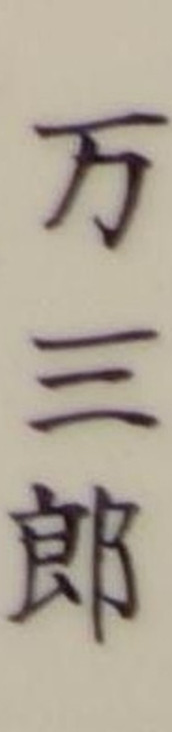万三郎
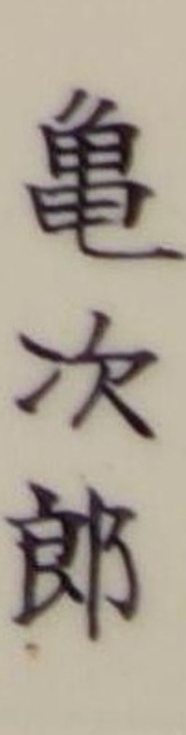亀次郎
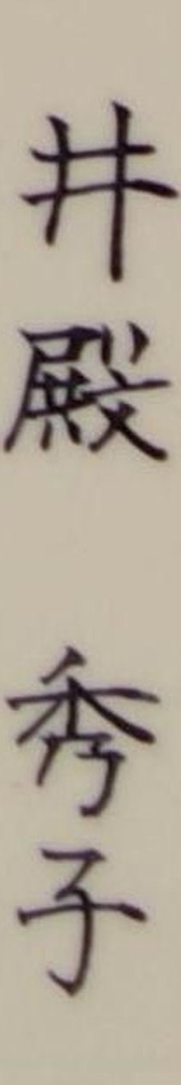井殿秀子
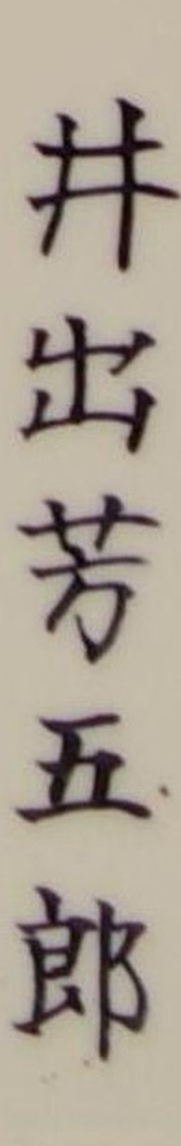井出芳五郎
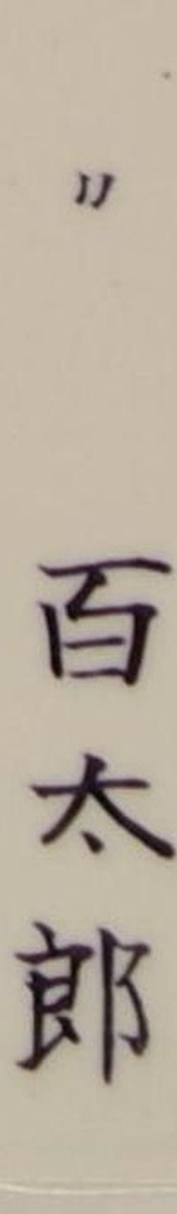百太郎
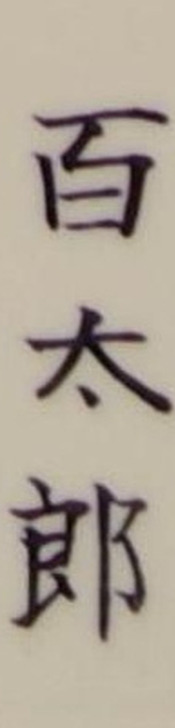百太郎
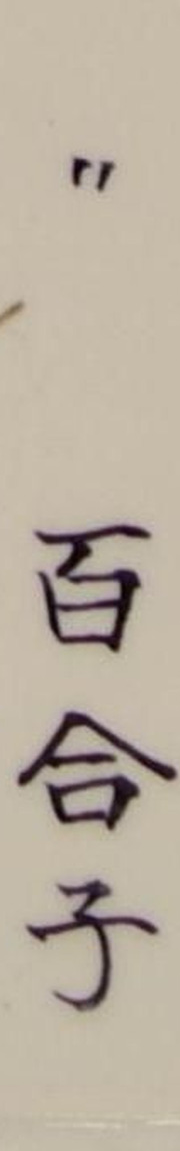百合子
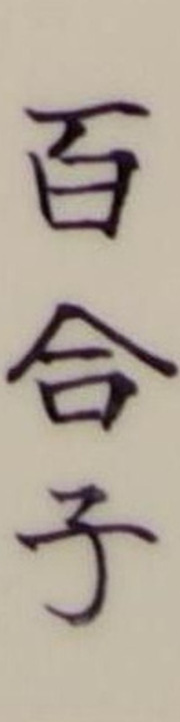百合子
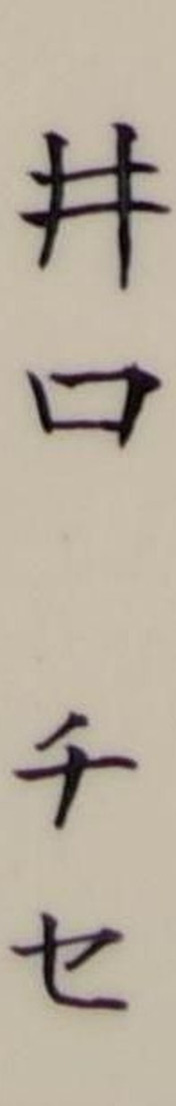井口チセ
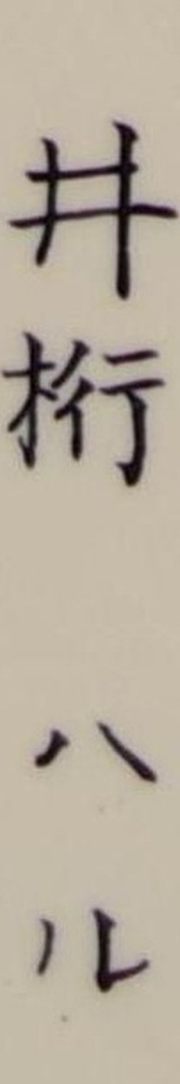井桁ハル
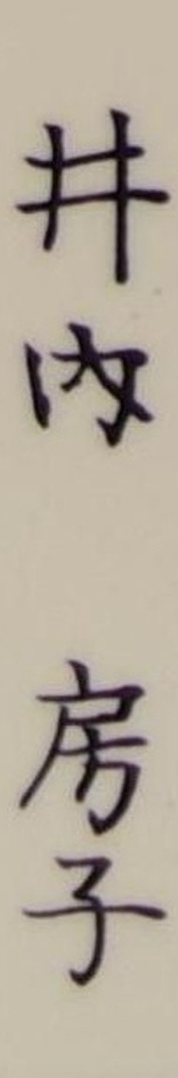井内房子
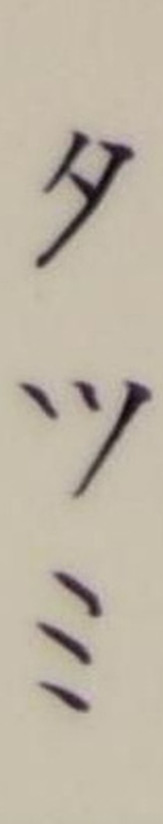タツミ
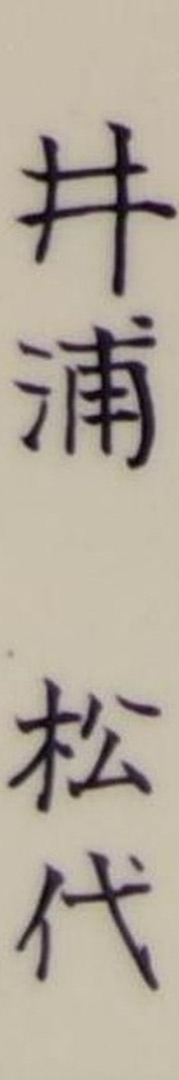井浦松代
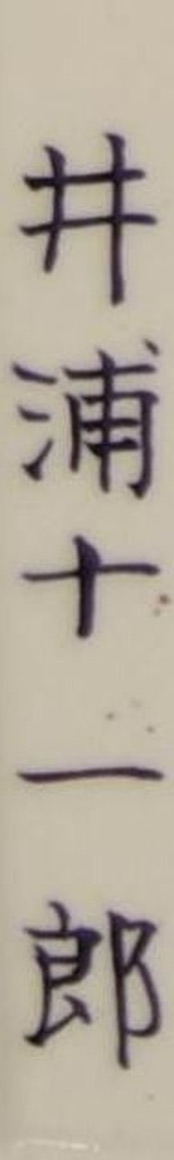井浦十一郎

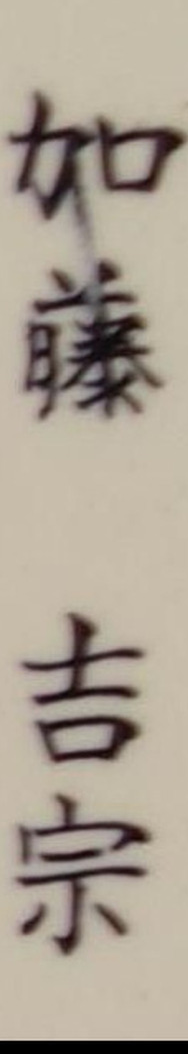加藤吉宗
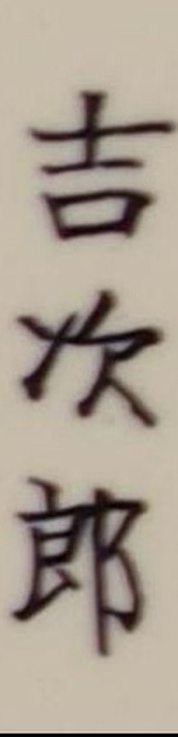吉次郎
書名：M~S
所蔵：高野山金剛峯寺
